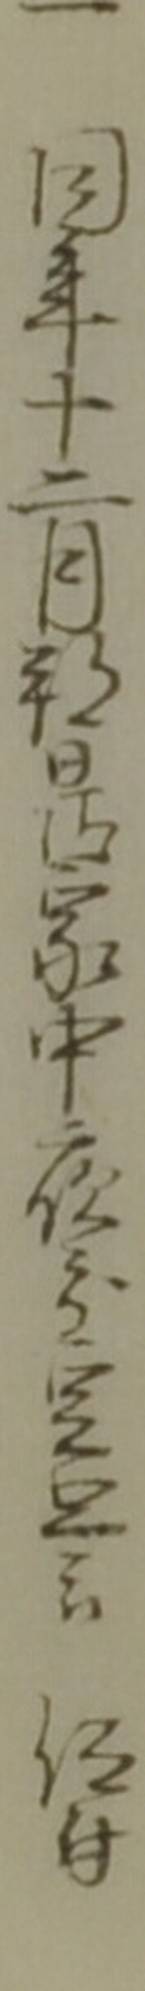一同年十二月朔日御家中夜分足廻被仰付
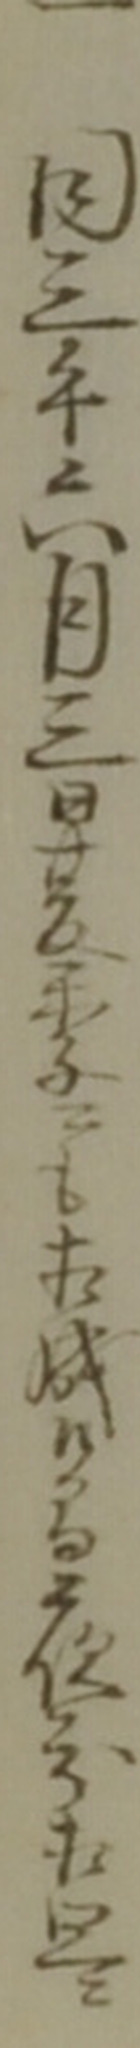一同三午六月三日夏季ニも相成候間夜分相廻ニ
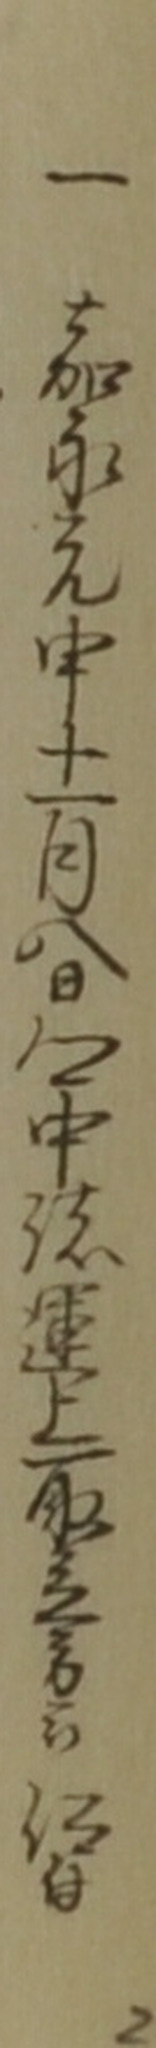一嘉永元申十一月八日郷中諸運上取立方被仰付
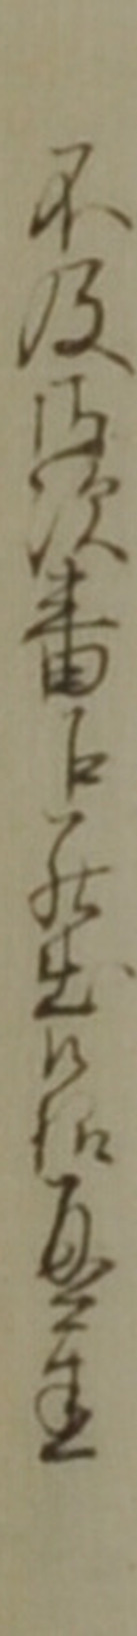不及御次番江罷出候様通達
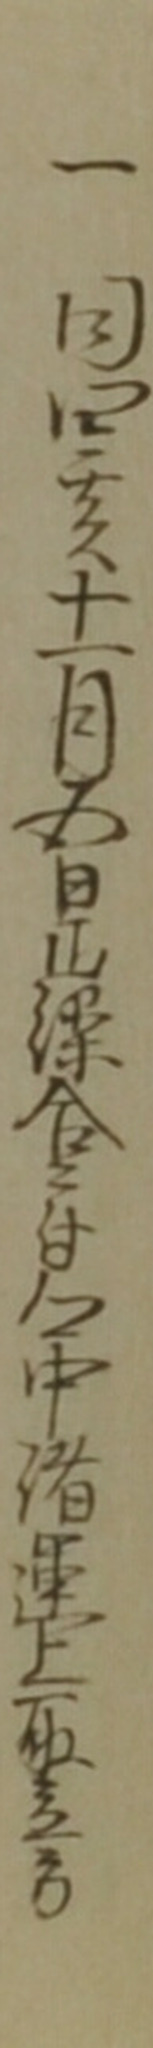一同四亥十一月五日御繰合ニ付郷中諸運上取立方
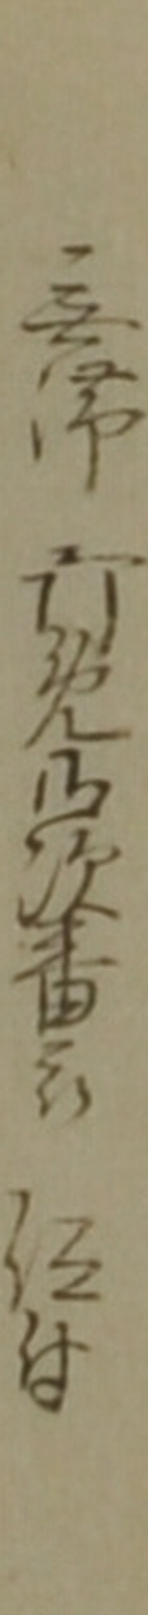無滞御免御次番被仰付

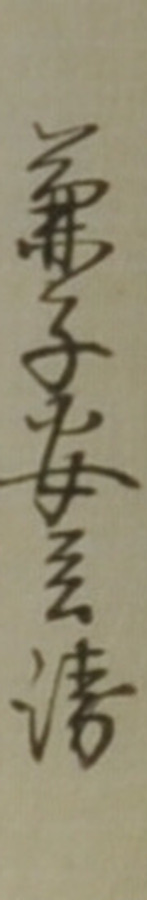兼子安兵衛
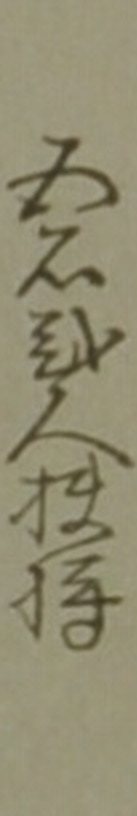五石弐人扶持
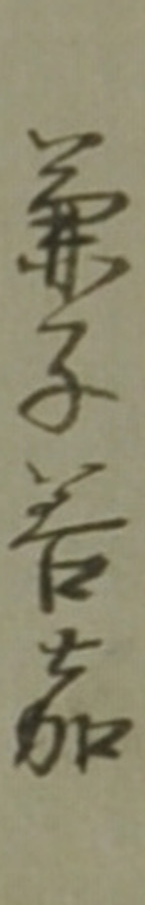兼子善嘉
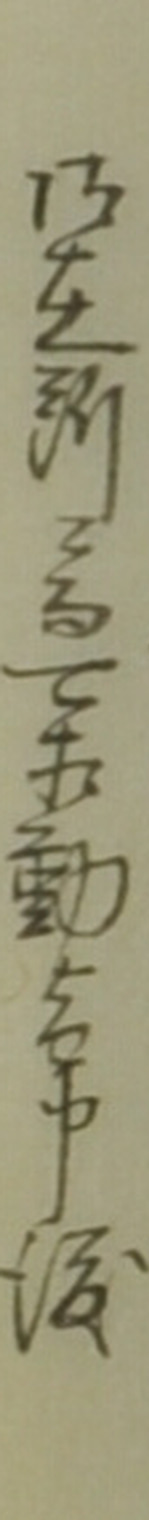御在所ニ而可相勤旨申渡

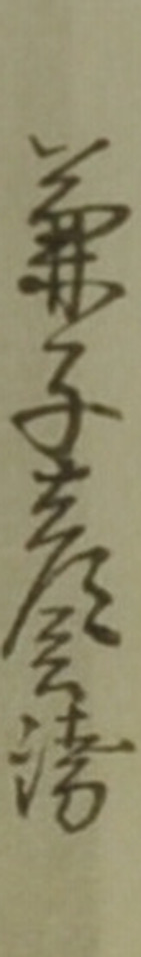兼子彦兵衛
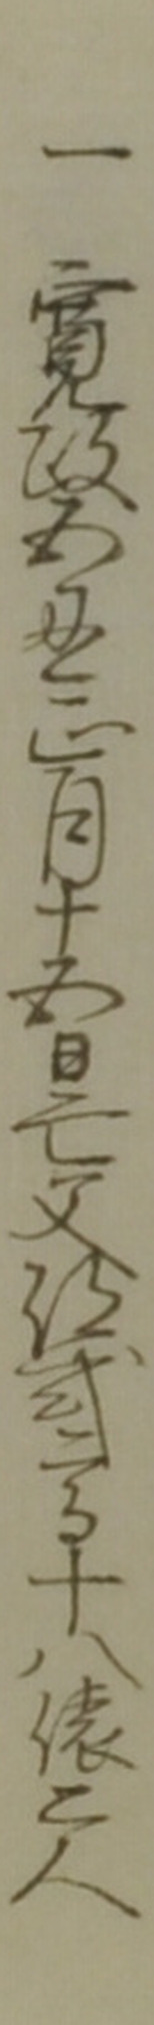一寛政五丑正月十五日亡父跡式高十八俵二人
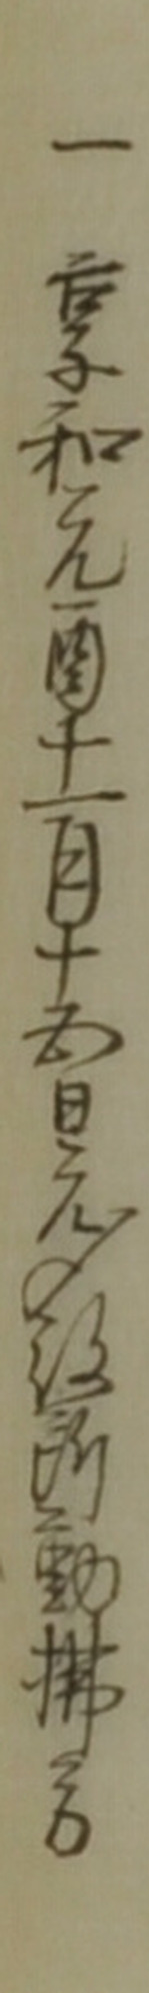一享和元酉十一月十五日元〆役所勤払方
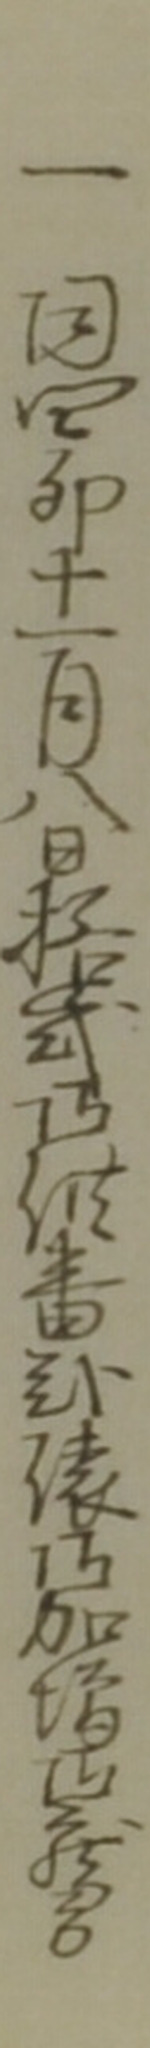一同四卯十一月八日格式御供番弐俵御加増御蔵方
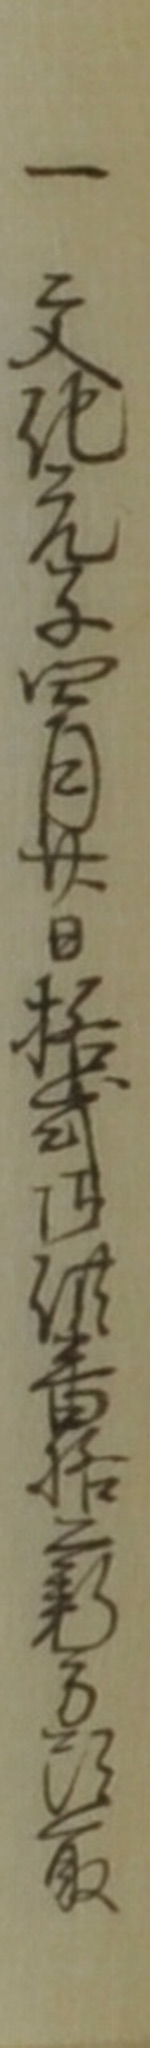一文化元子四月廿日格式御供番格薪方頭取
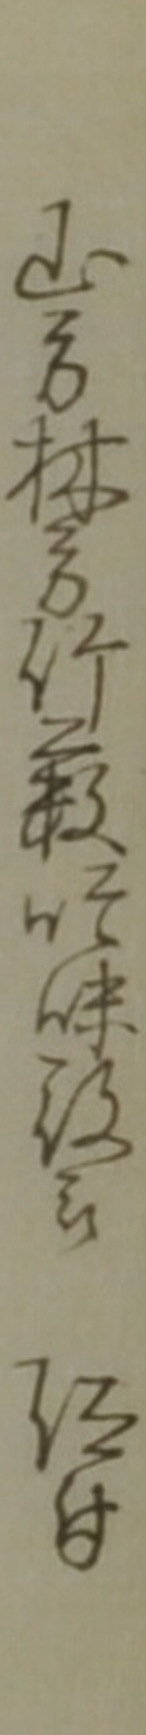山方林方竹薮吟味役被仰付
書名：無足諸士勤仕録（五）
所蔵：伊那市立高遠町図書館・合同会社AMANE
